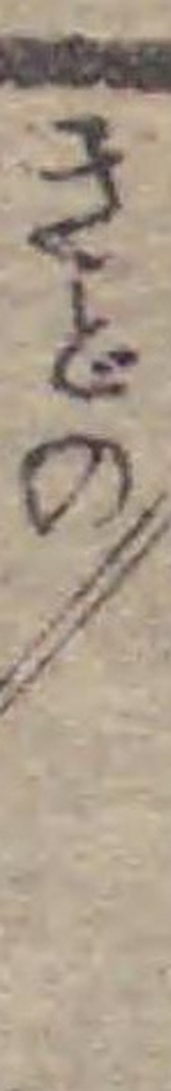きどの
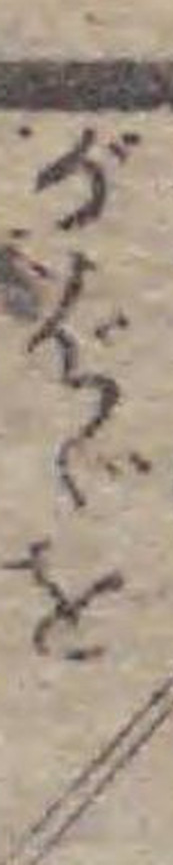がばゞを
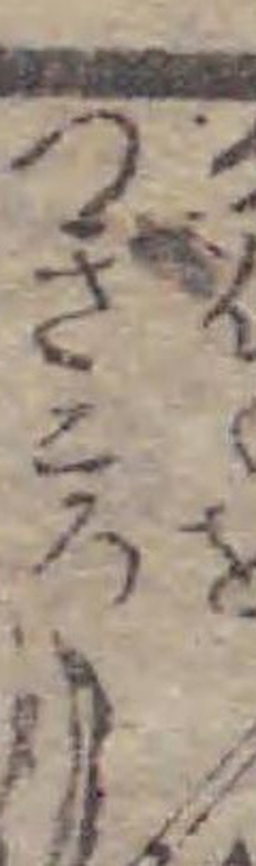つきころ
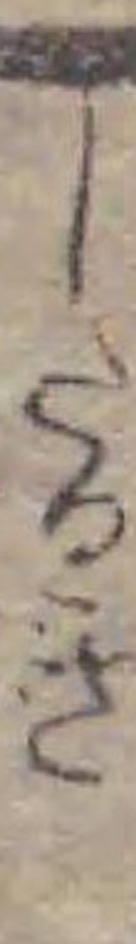したるき
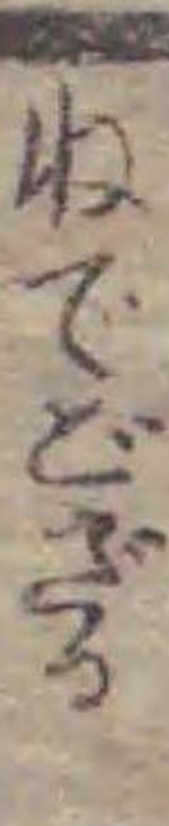ねでござる
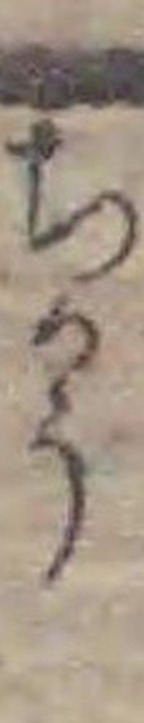ちかう
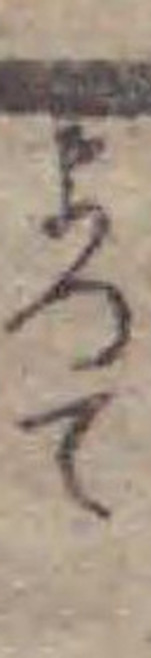よつて
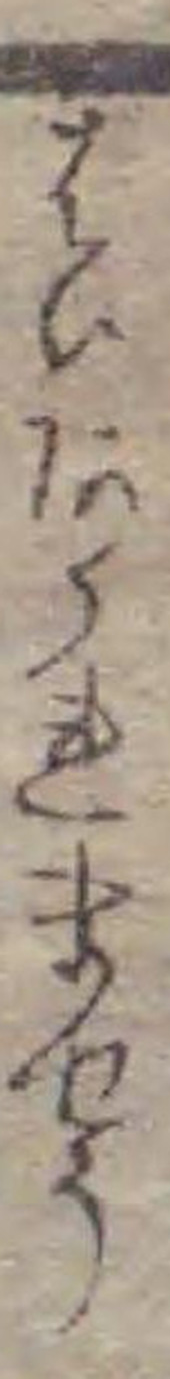はいあられませう
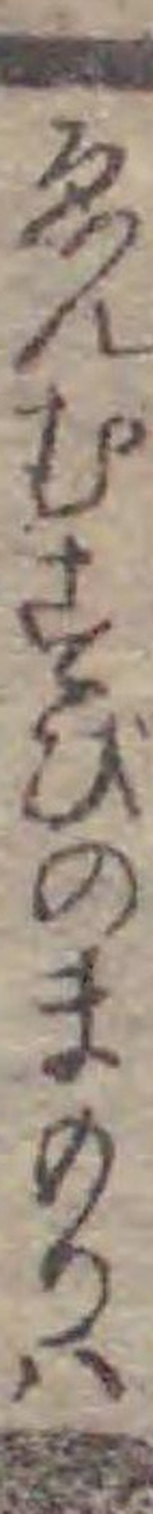ゑんむすびのまもりは
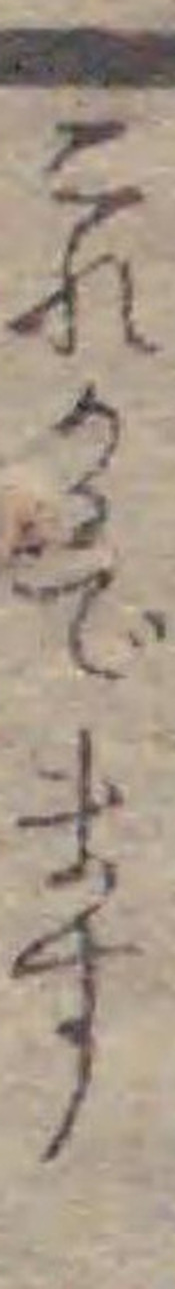これからでます
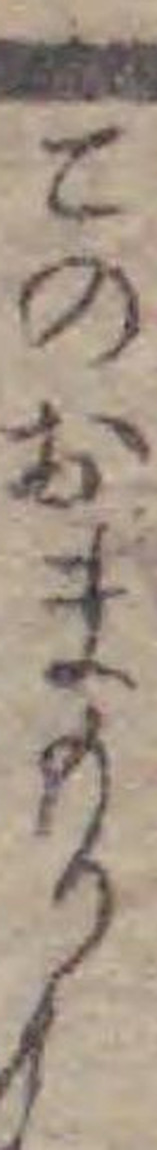このおまもり
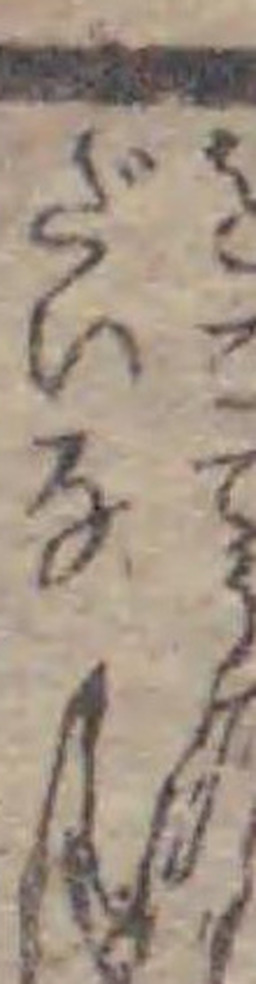だいな
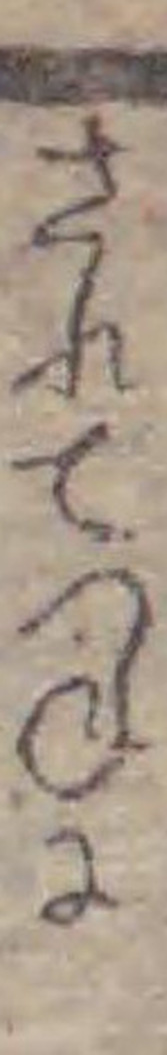されてつねに
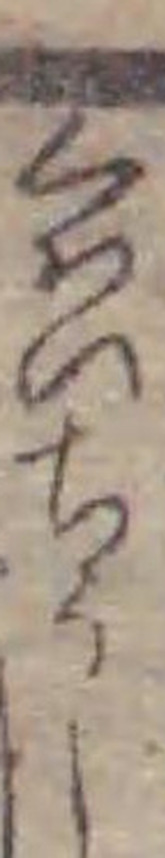くはいちう
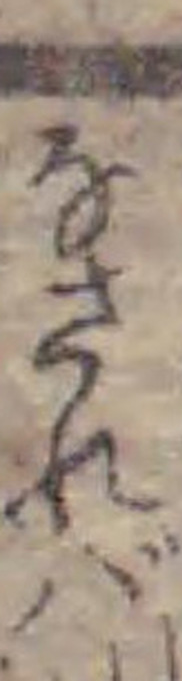なされば
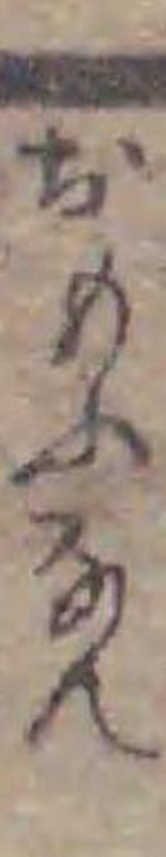おもふなん
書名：化物七段目 : 2巻
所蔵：国立国会図書館 National Diet Library, JAPAN
